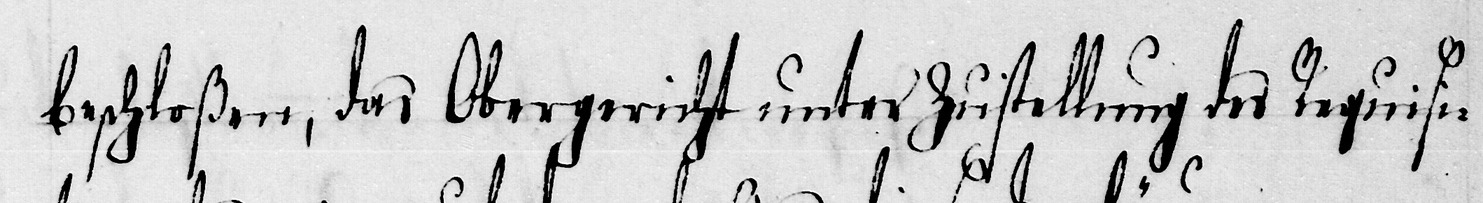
beschloßen, das Obergericht unter Zustellung des Requisi¬
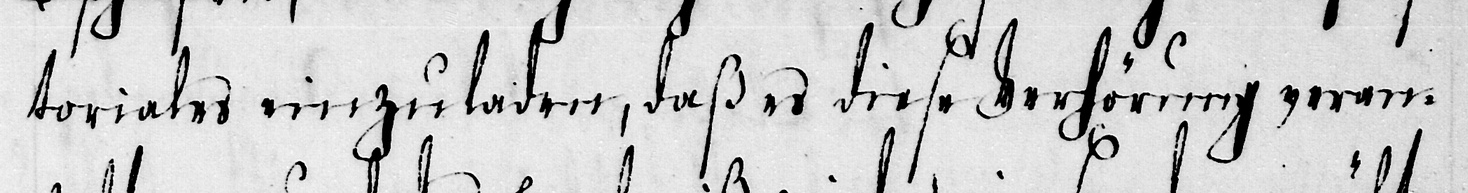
toriales einzuladen, daß es diese Verhörung veran¬
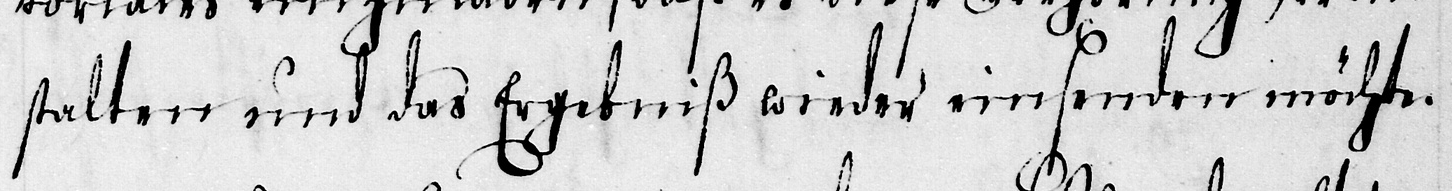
stalten und das Ergebniß wieder einsenden möchte.
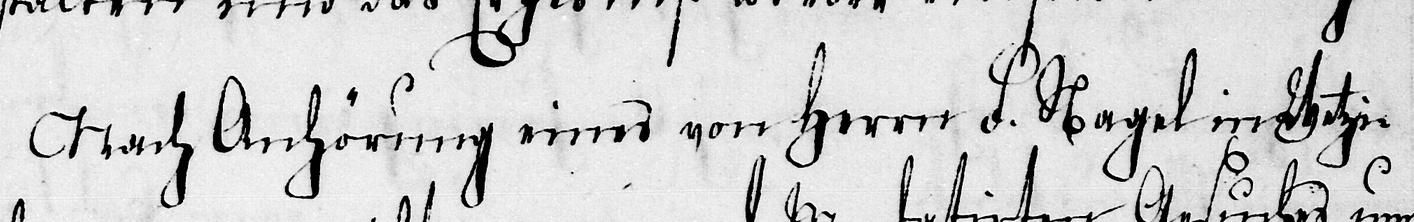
Nach Anhörung eines von Herrn F. Nagel in Wetzi¬
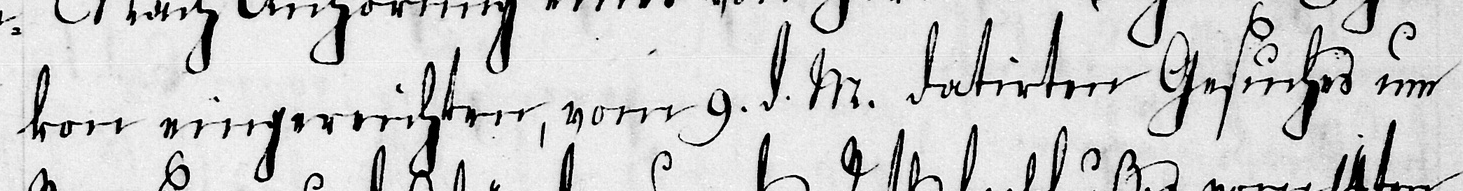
kon eingereichten, vom 9. d. M. datirten Gesuches um
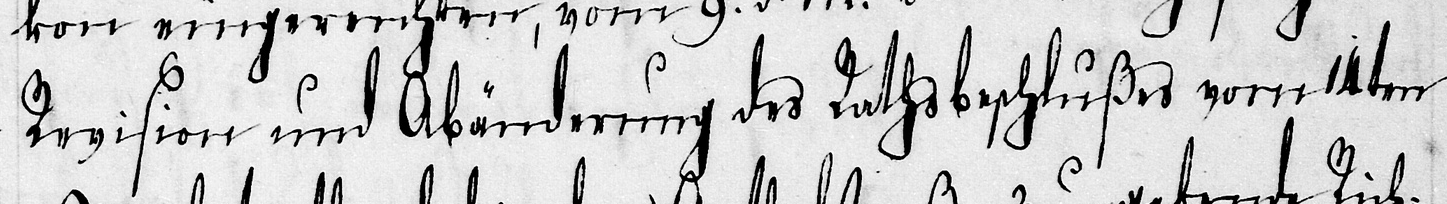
Revision und Abänderung des Rathsbeschlußes vom 14ten
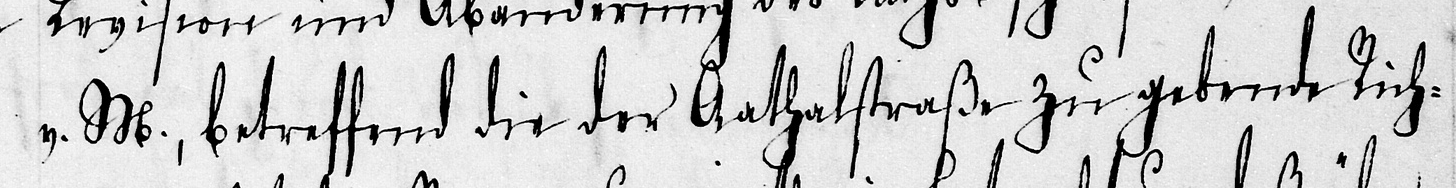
v. M., betreffend die der Aathalstraße zu gebende Rich¬
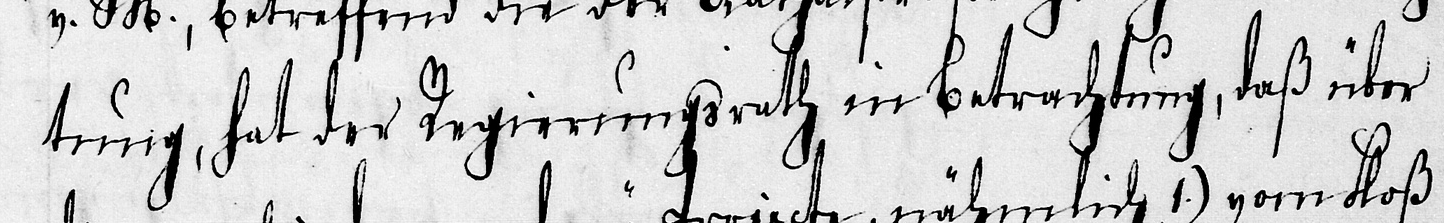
tung, hat der Regierungsrath in Betrachtung, daß über
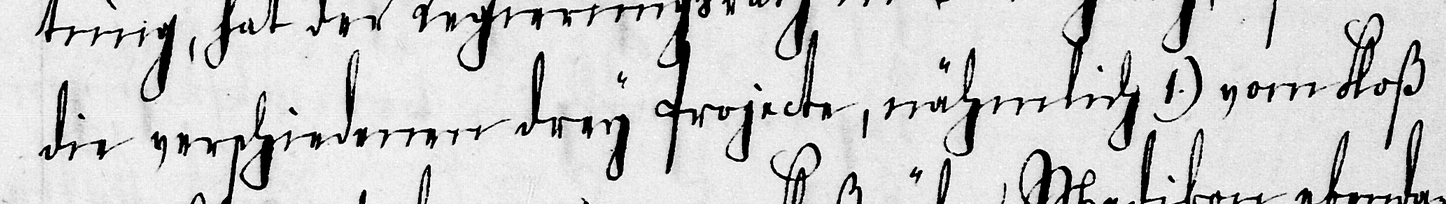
die verschiedenen drey Projecte, nämlich 1.) vom Floß
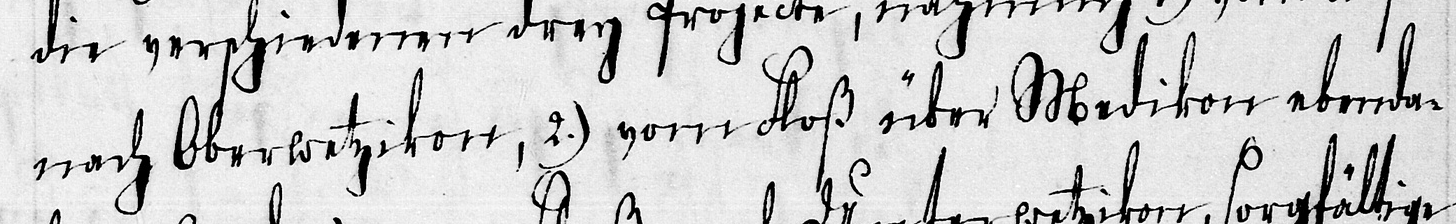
nach Oberwetzikon, 2.) vom Floß über Medikon ebenda¬
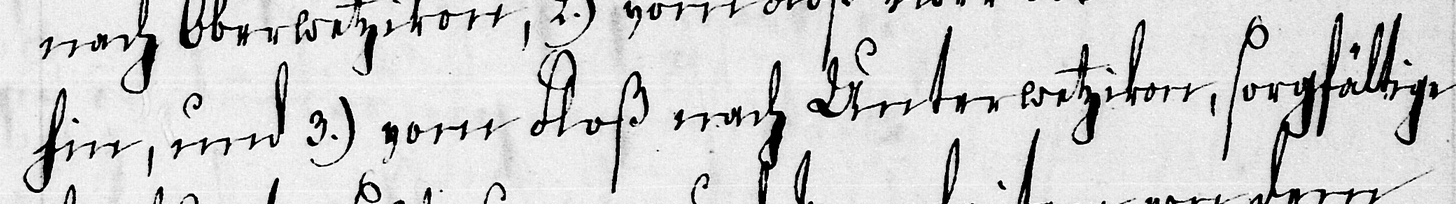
hin, und 3.) vom Floß nach Unterwetzikon, sorgfältige
